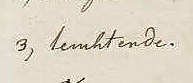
3, leuchtende.
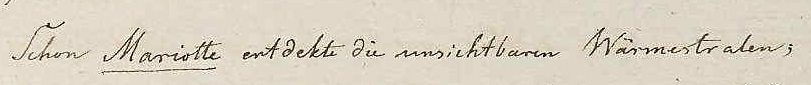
Schon Mariotte entdekte die unsichtbaren Wärmestralen;
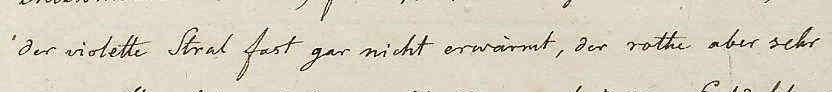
der violette Stral fast gar nicht erwärmt, der rothe aber sehr
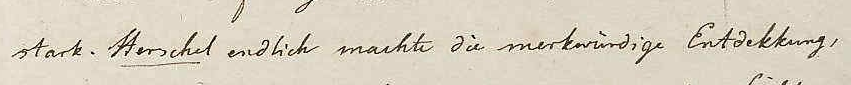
stark. Herschel endlich machte die merkwürdige Entdekkung,
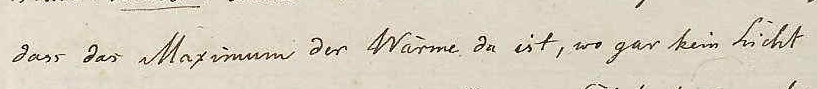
dass das Maximum der Wärme da ist, wo gar kein Licht
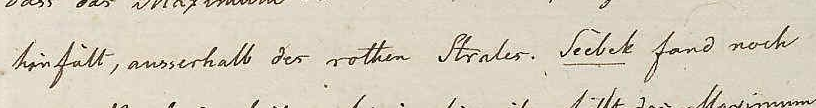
hinfält, ausserhalb des rothen Strales. Seebek fand noch
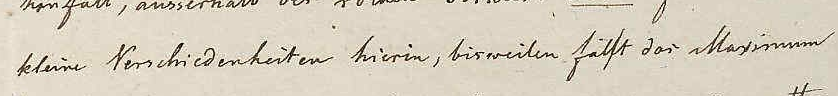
kleine Verschiedenheiten hierin, bisweilen fällt das Maximum
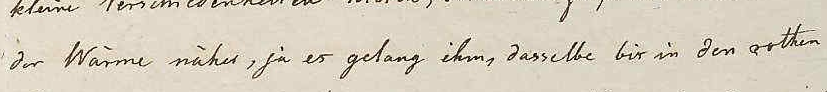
der Wärme näher, ja es gelang ihm, dasselbe bis in den rothen
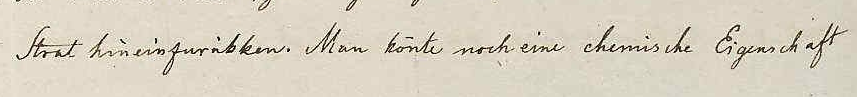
Stral hineinzurükken. Man könte noch eine chemische Eigenschaft
